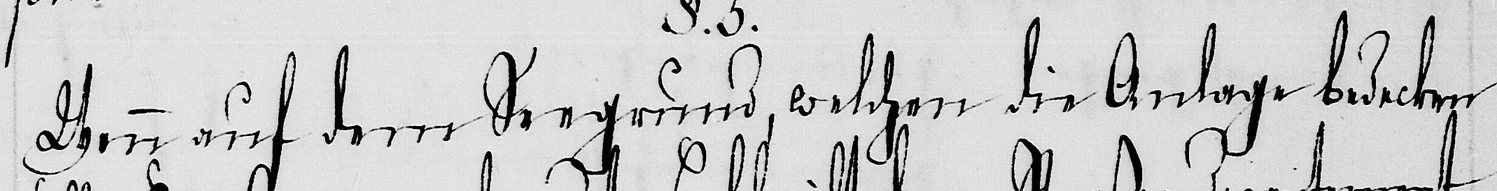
Wenn auf dem Seegrund, welchen die Anlage bedecken
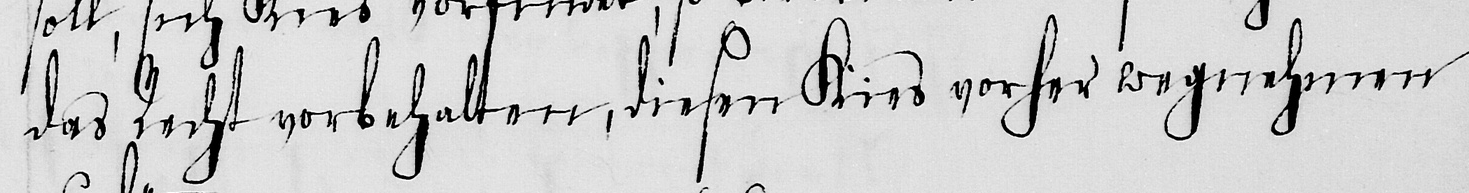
das Recht vorbehalten, diesen Kies vorher wegnehmen
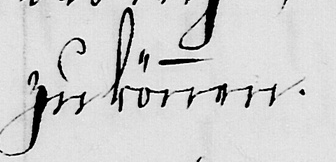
zu können.
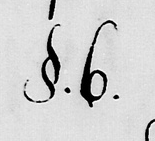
§. 6.
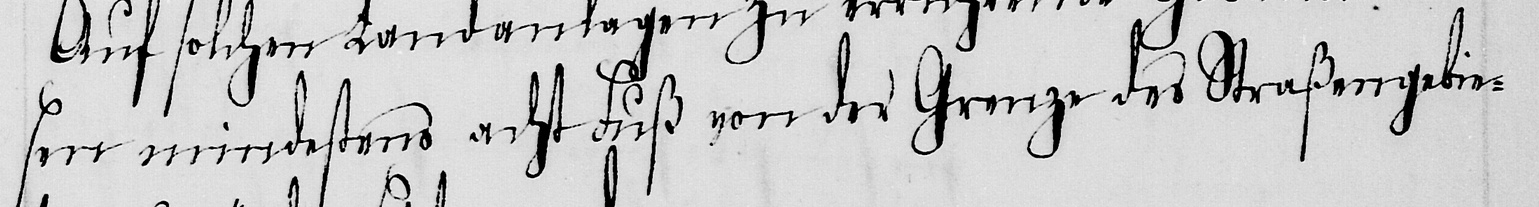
en mindestens acht Fuß von der Grenze des Straßengebie¬
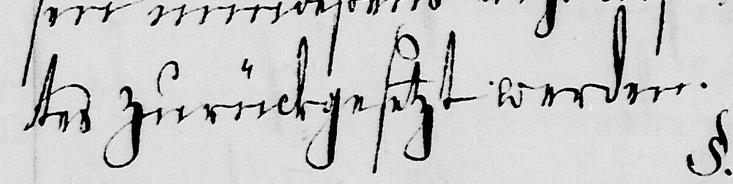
tes zurückgesetzt werden.
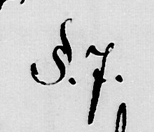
§. 7.
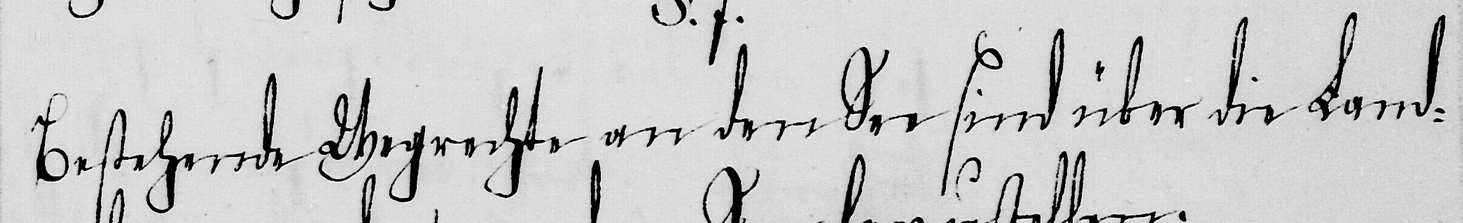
Bestehende Wegrechte an den See sind über die Land¬
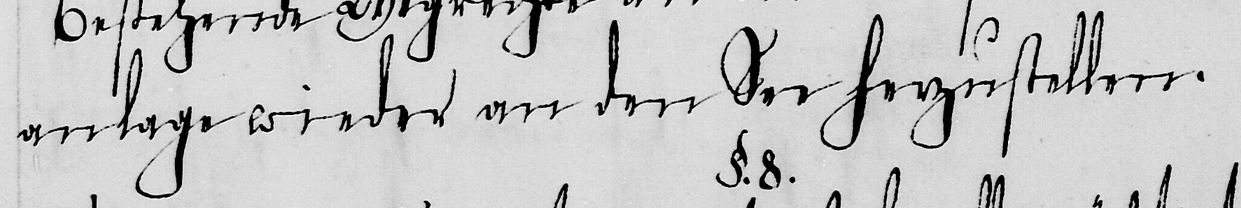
anlage wieder an den See herzustellen.
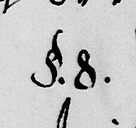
§. 8.
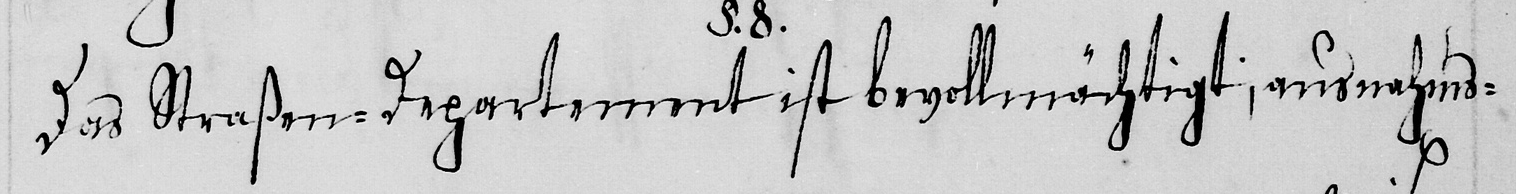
Das Straßen-Departement ist bevollmächtigt, ausnahms-
